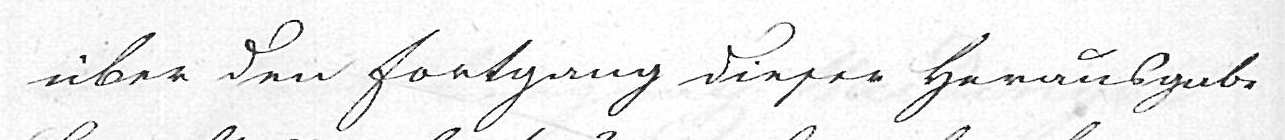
über den Fortgang dieser Herausgabe
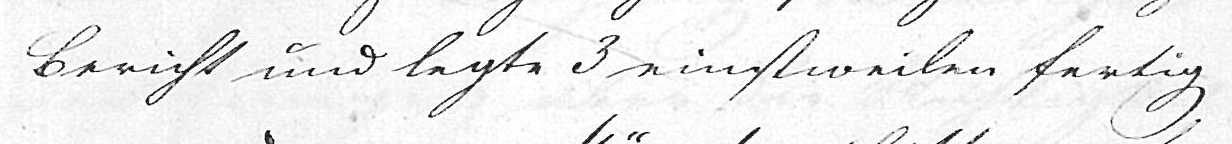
Bericht und legte den einstweilen fertig
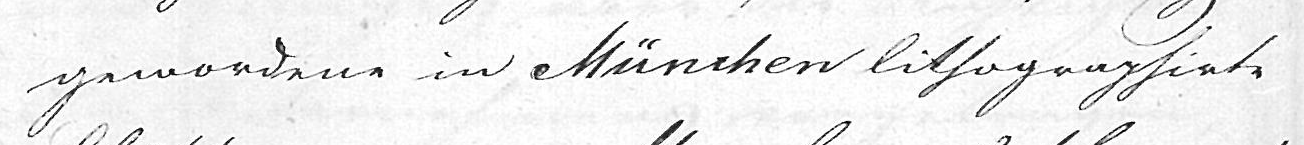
gewordene in München lithographirte
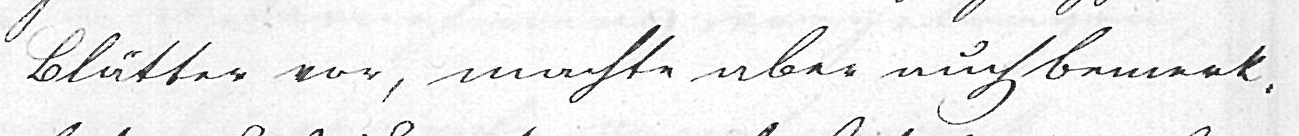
Blätter vor, machte aber auch bemerk-
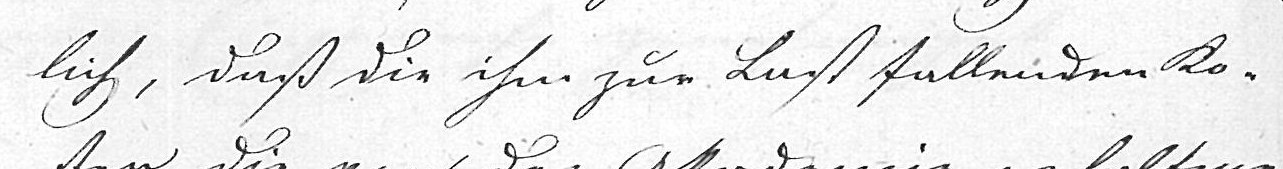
lich, daß die ihm zur Last fallenden Ko-
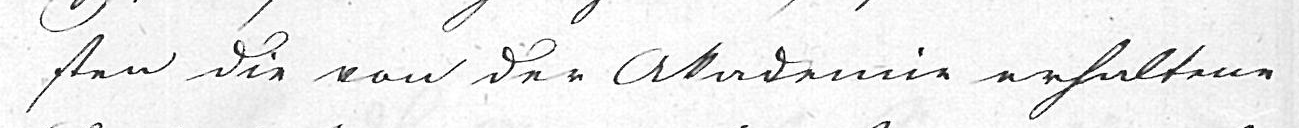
sten die von der Akademie erhaltene
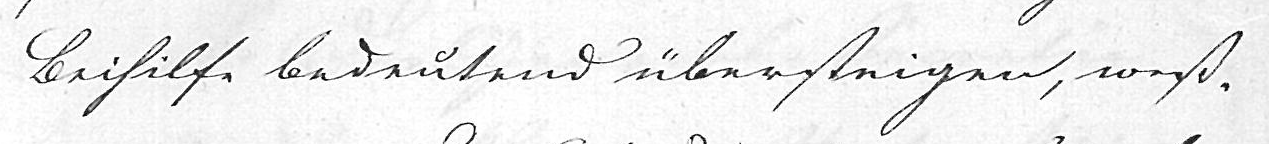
Beihilfe bedeutend übersteigen, weß-
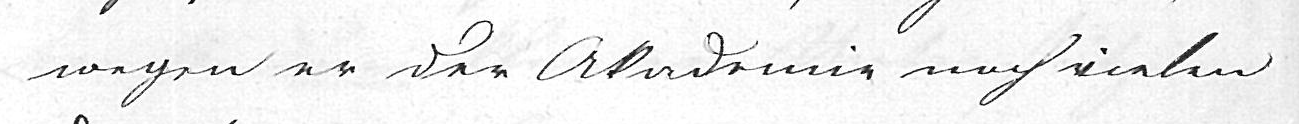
wegen er der Akademie noch vielen
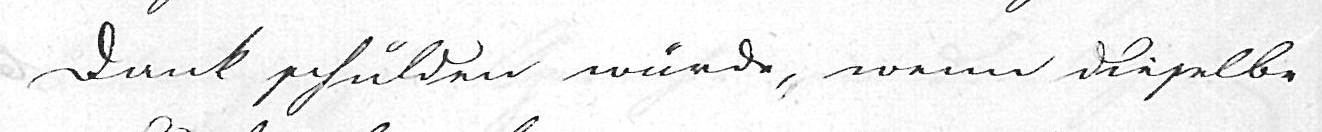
Dank schulden würde, wenn dieselbe
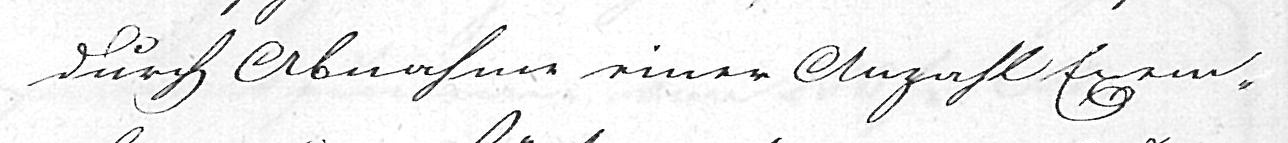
durch Abnahme einer Anzahl Exem-
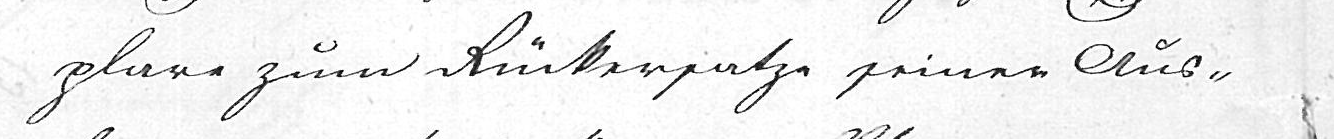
plare zum Rückersatzes seiner Aus-
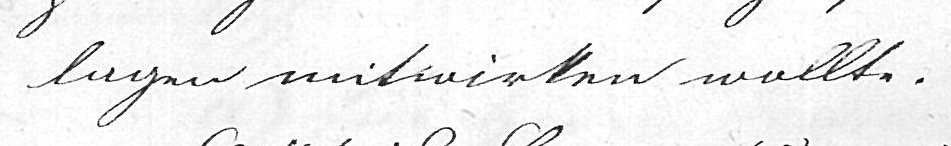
lagen mitwirken wollte.
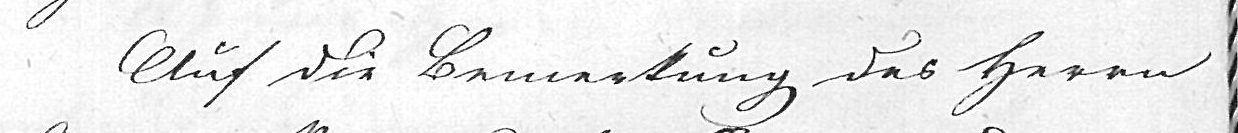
Auf die Bemerkung des Herrn
